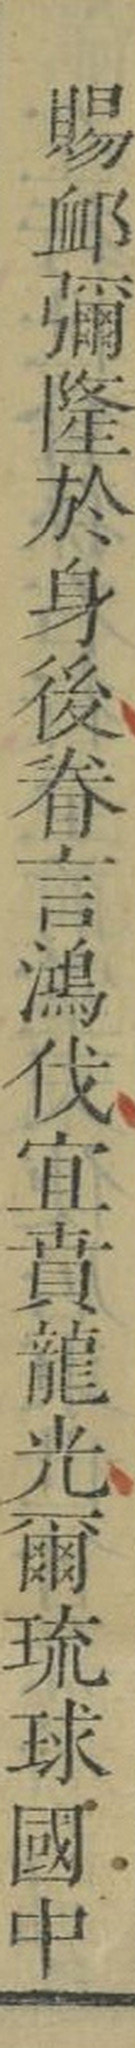賜䘏彌隆於身後眷言鴻伐宜賁龍光爾琉球國中
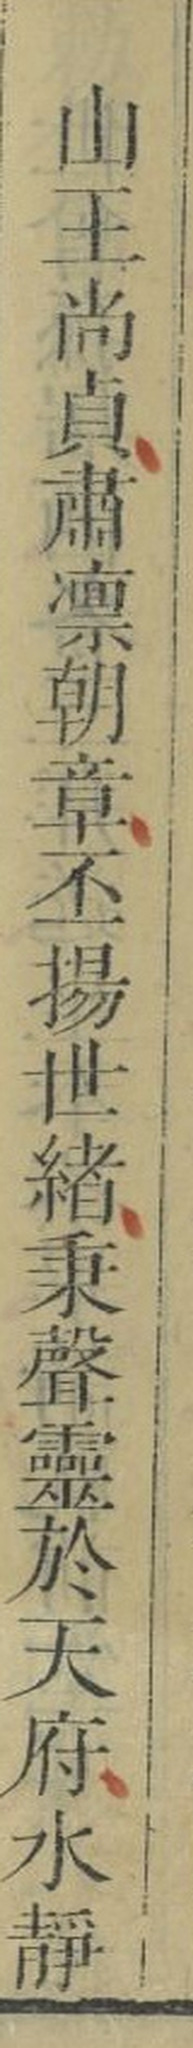山王尚貞肅凛朝章丕揚世緖秉聲靈於天府水靜
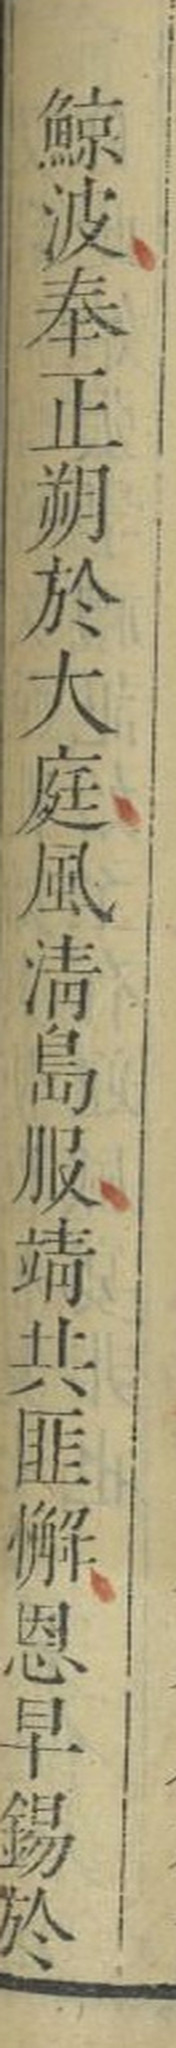鯨波奉正朔於大庭風淸島服靖共匪懈恩早錫於
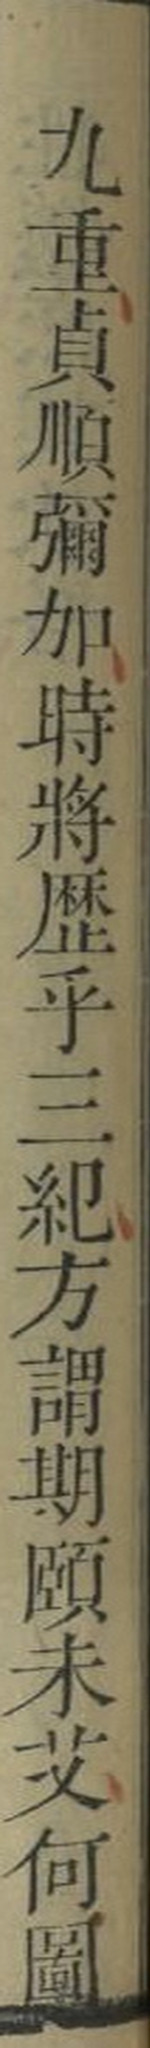九重貞順彌加時將歴乎三紀方謂期頤未艾何圖
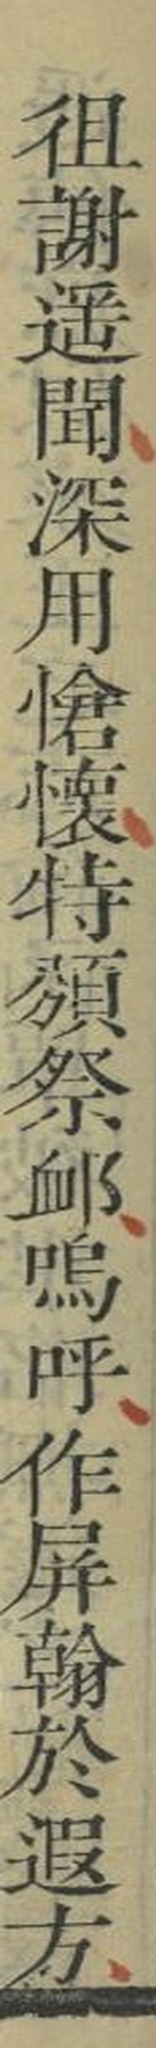徂謝遥聞深用愴懷特領祭䘏嗚呼作屏翰於遐方
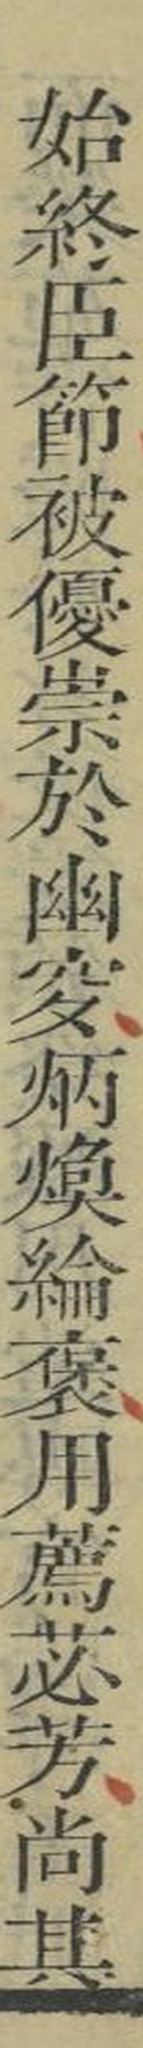始終臣節被優崇於幽穸炳煥綸褒用薦苾芳尚其
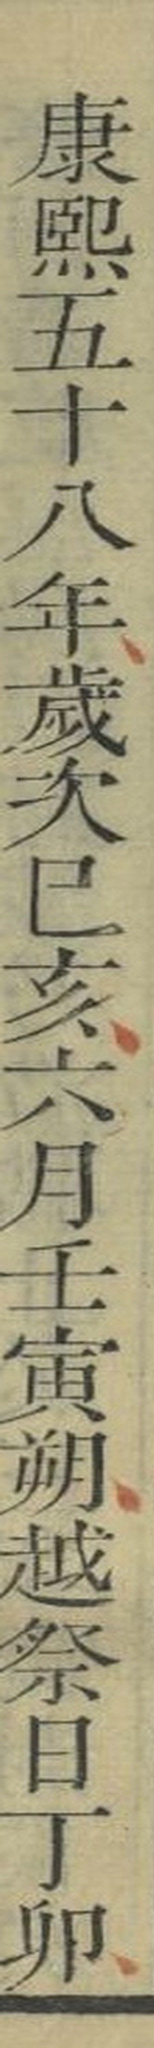康煕五十八年歲次巳亥六月壬寅朔越祭日丁卯
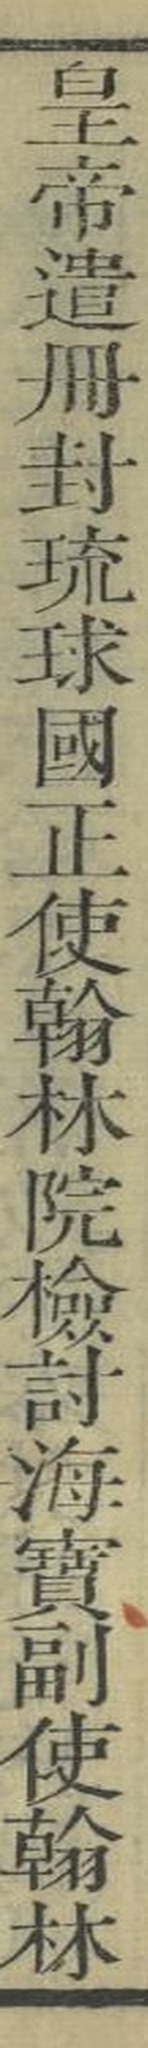皇帝遣冊封琉球國正使翰林院檢討海寶副使翰林
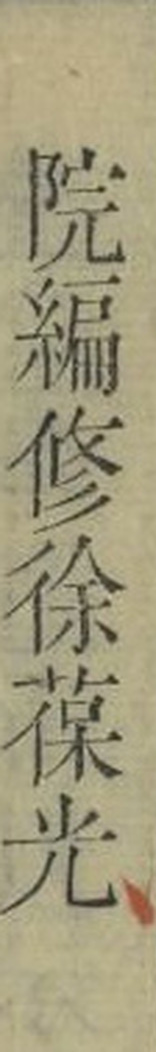院編修徐葆光
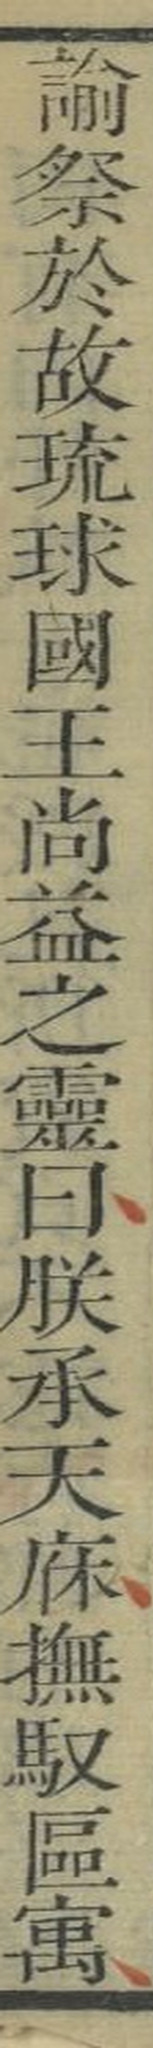諭祭於故琉球國王尚益之靈曰朕承天庥撫馭區㝢

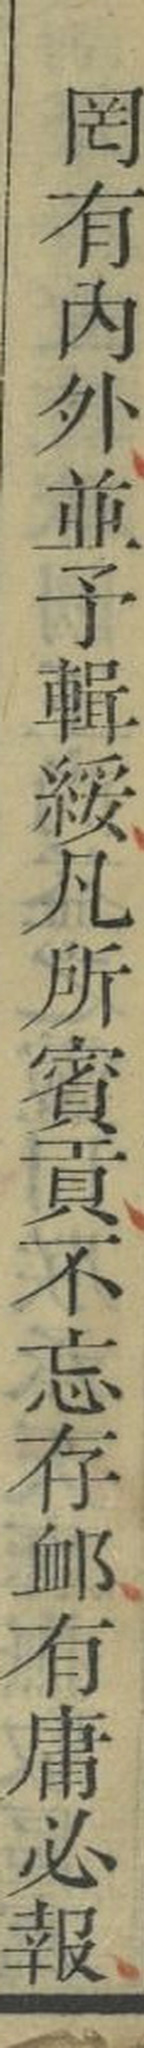罔有内外並予輯綏凡所賓貢不忘存䘏有庸必報
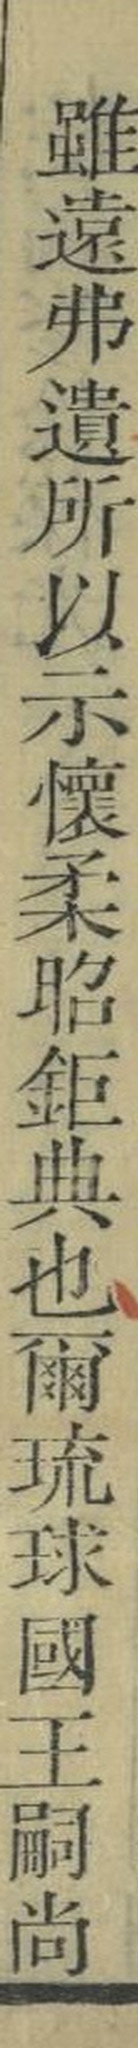雖遠弗遺所以示懷柔昭鉅典也爾琉球國王嗣尚
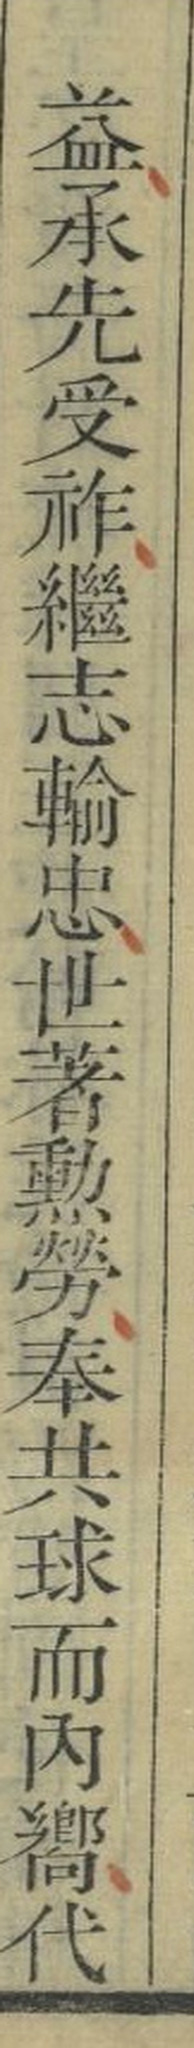益承先受祚繼志輪忠世著勳勞奉共球而内嚮代
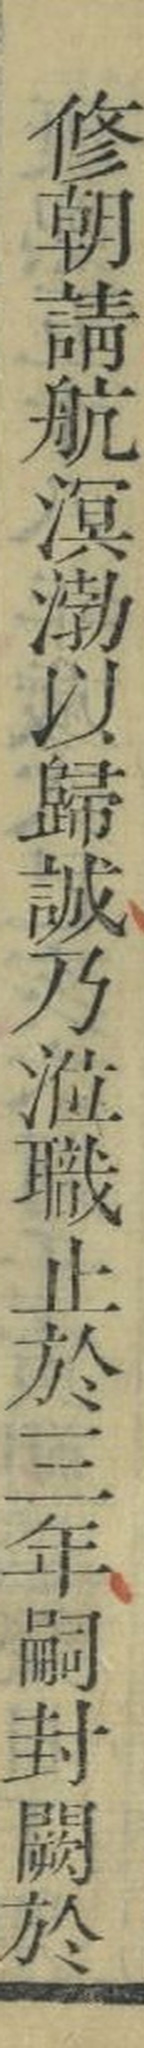修朝請航溟渤以歸誠乃涖職止於三年嗣封闕於
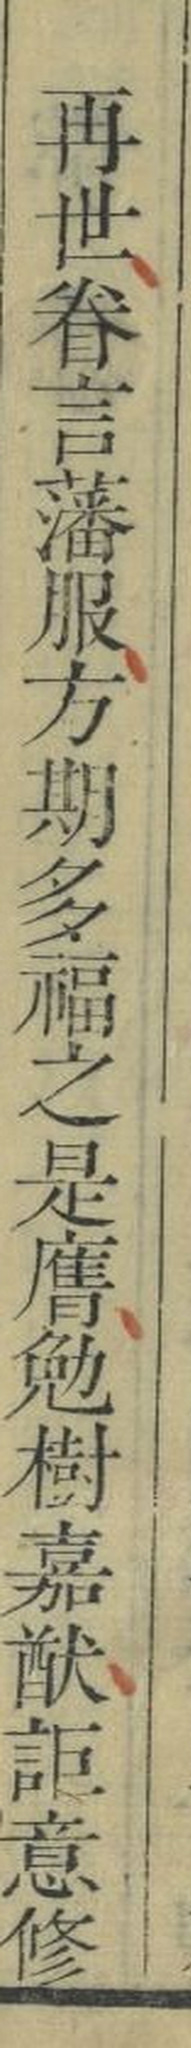再世眷言藩服方期多福之是膺勉樹嘉猷詎意修
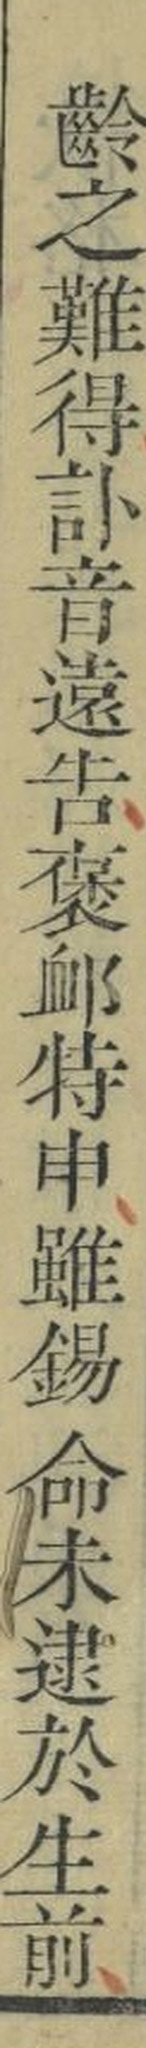齡之難得訃音遠告褒䘏特申雖錫命未逮於生前
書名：中山伝信録 巻一、巻二
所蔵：University of the Ryukyus Library
